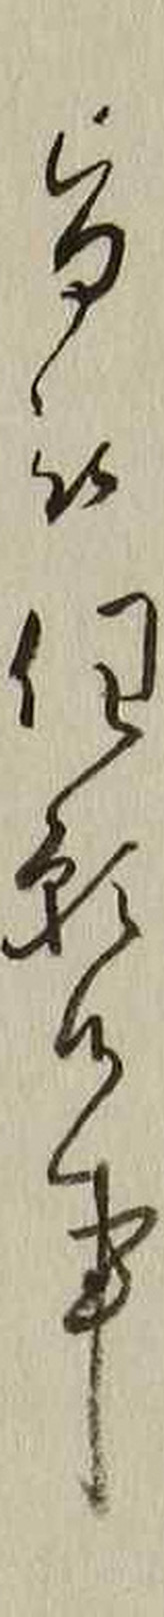旨被任願候事
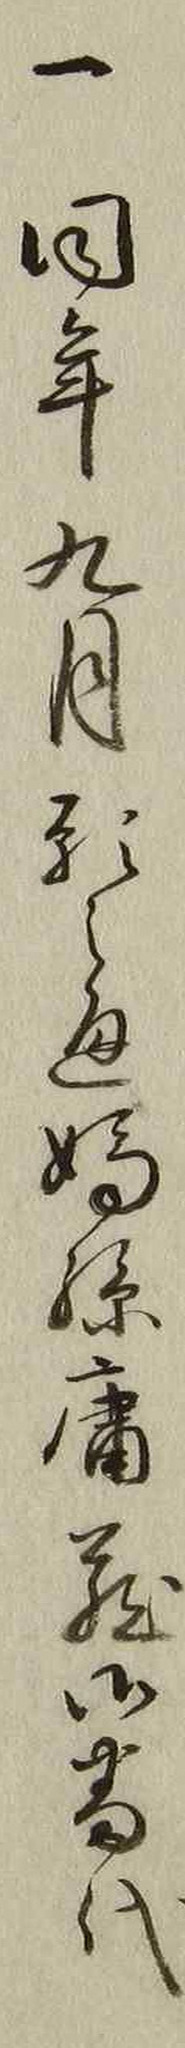一同年九月願之通嫡孫庸蔵御番代
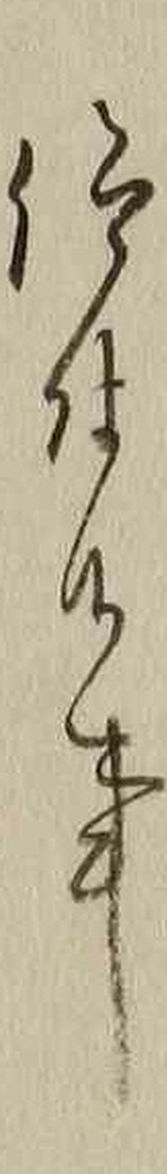仰付候事
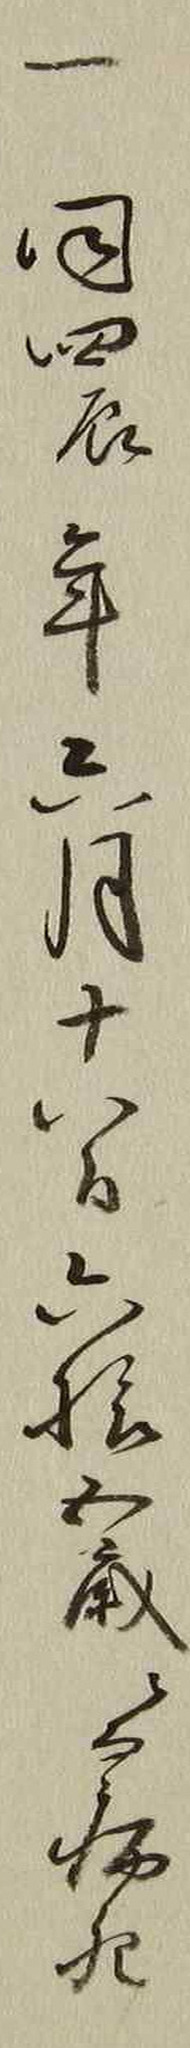一同四辰年六月十八日六拾五歳ニ而病死
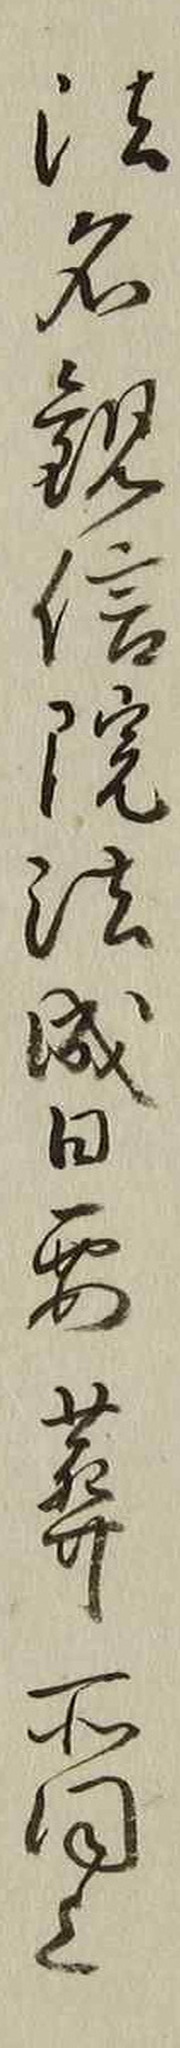法名観信院法成日要葬所同上
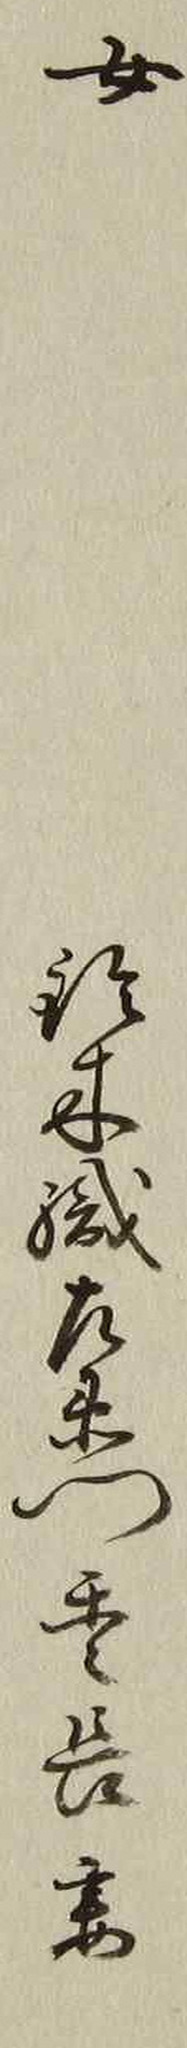女鈴木織左衛門長妻
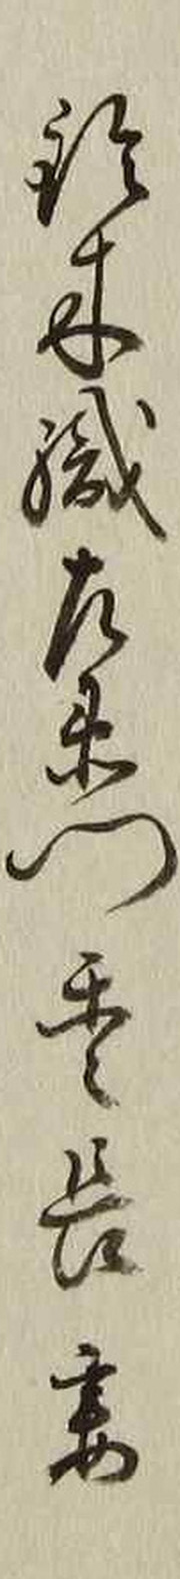女鈴木織左衛門長妻
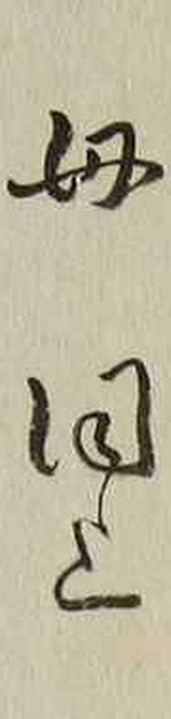母同上
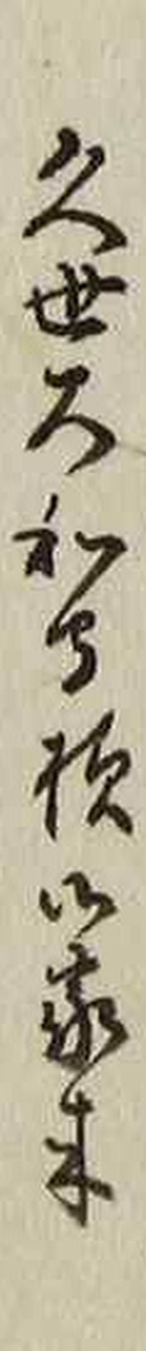久世大和守様家来
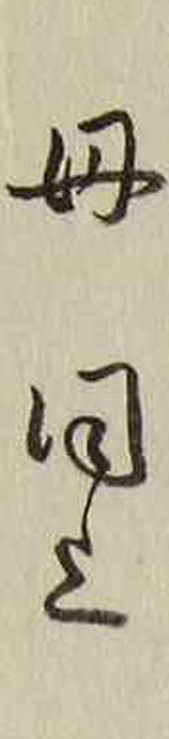母同上

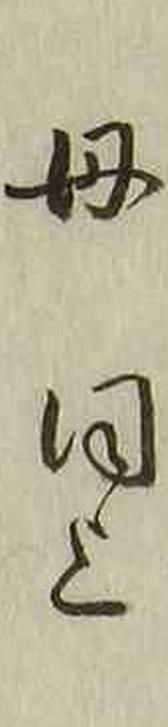母同上
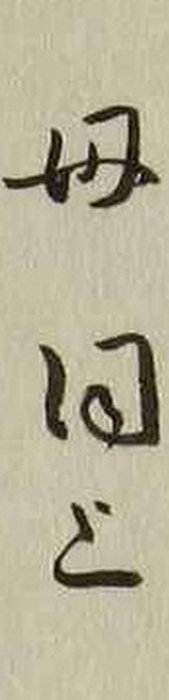母同上
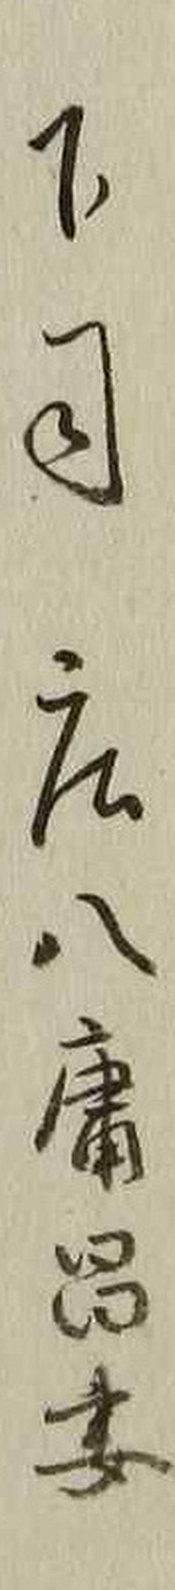下司庄八庸昌妻
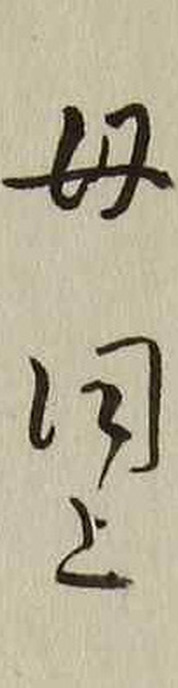母同上
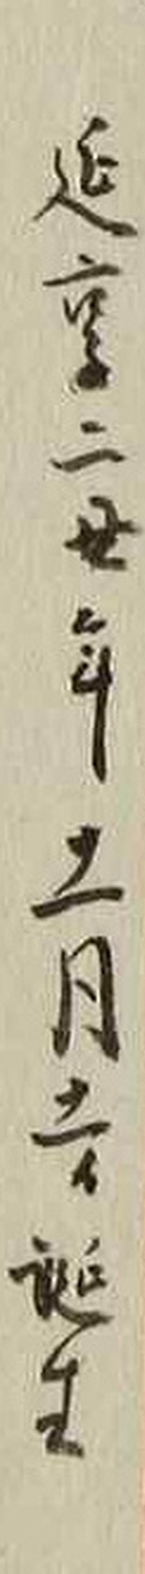延享二丑年十一月十一日誕生
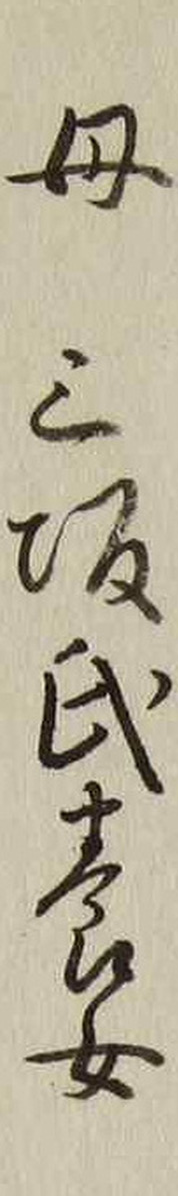母三坂氏養女
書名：諸士系譜　巻之4　い之部4
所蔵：会津若松市立会津図書館
